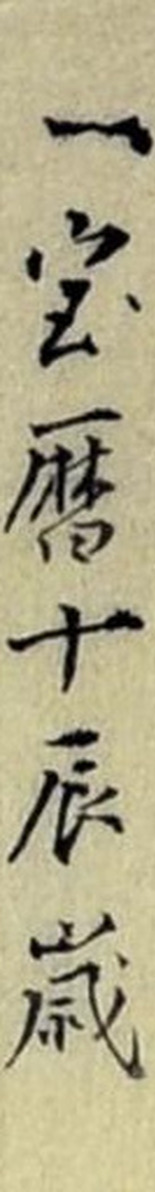一宝暦十辰歳
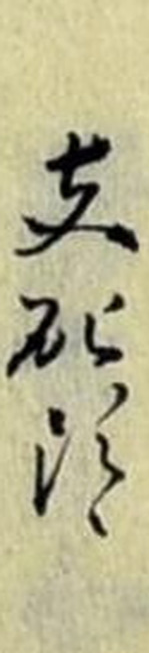支配頭へ
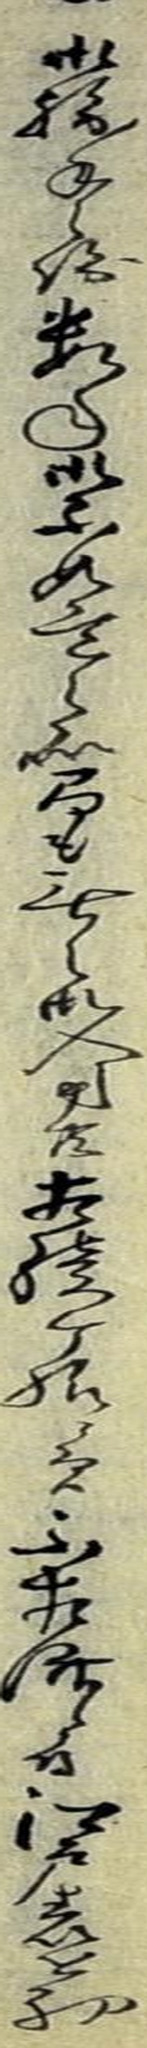〇御勝手之儀数年御不如意候処間も無之御入用共相続ケ様に而は不相済に付江戸表を初
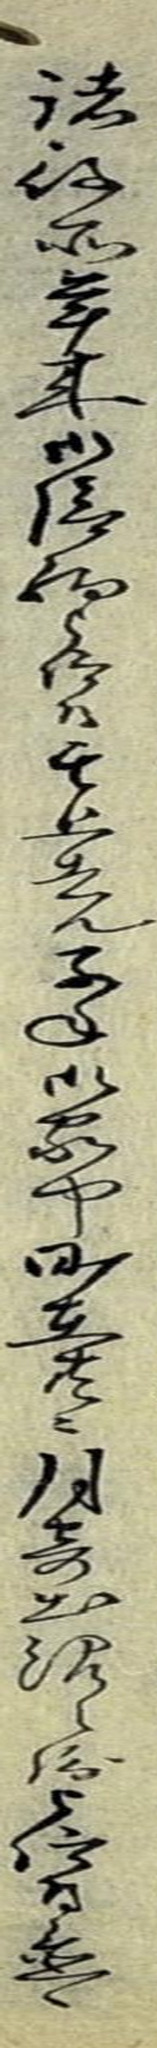諸役所年来御倹約被仰付其上去る子年御家中町在共に月寄出銀之儀被仰付置候
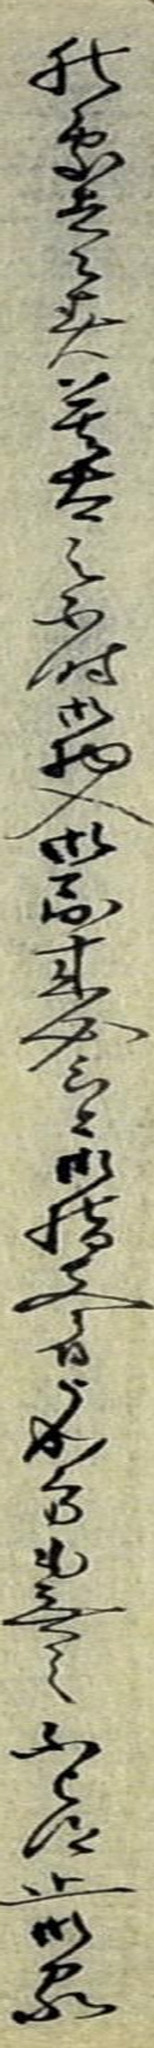然処去々春莫太之不時御物入御到来必至は御差支に付被成方も無之不被得止御家
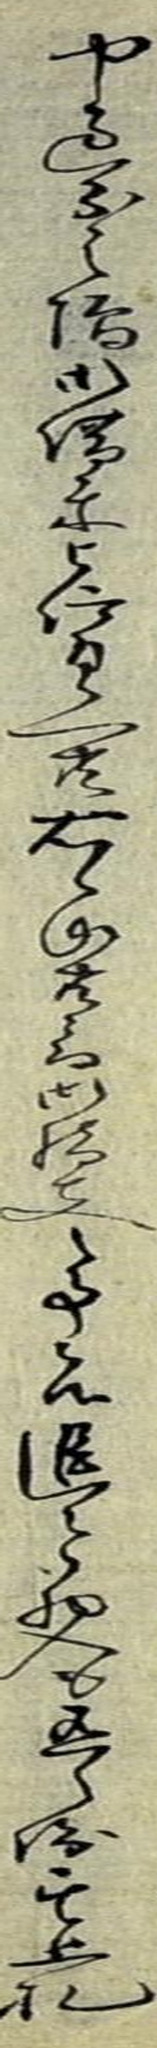中過分之増御借米被仰付候へ共右之趣共に而御指支之事に候追々御物入も有之儀其上札
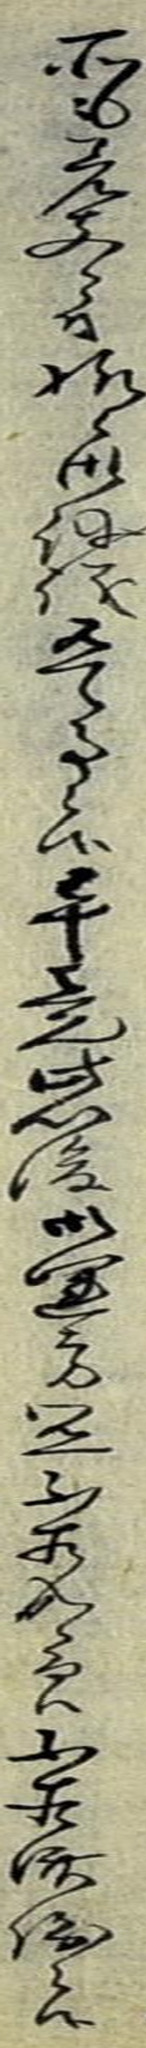所も差支に付様々御評儀有之事に候畢竟此以後御運方宜不相成候而は不相済儀に候
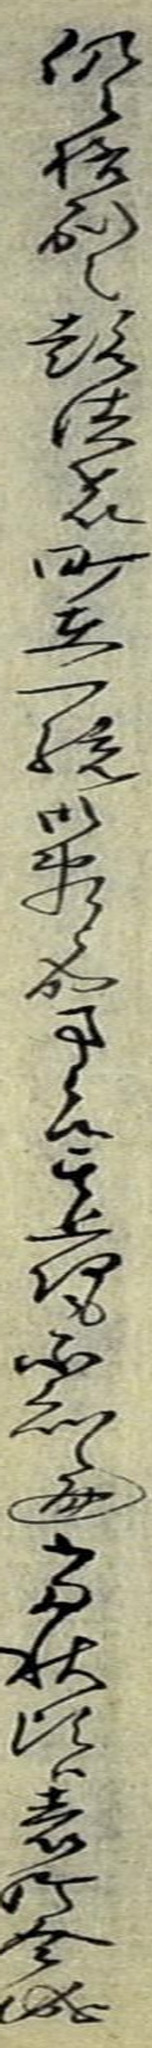仍之格別之趣法を以町在一統御頼被成用之候其上何も承知之通当秋頃は表御登城
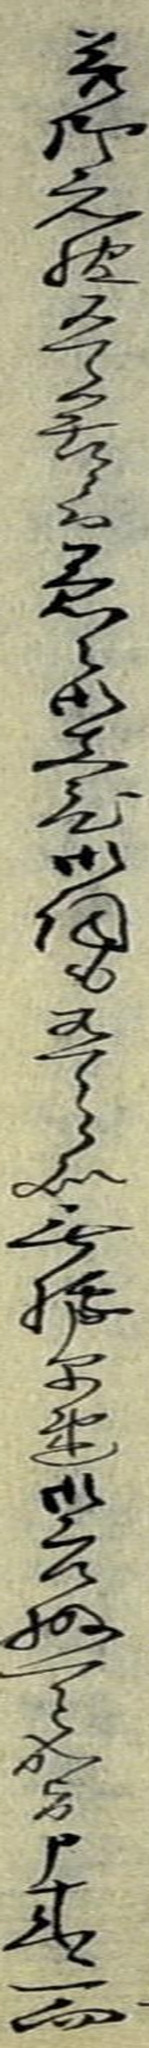并御元服有之筈に而急之御支度御伺も有之候処無拠早速御取扱可被成旨申来候一向
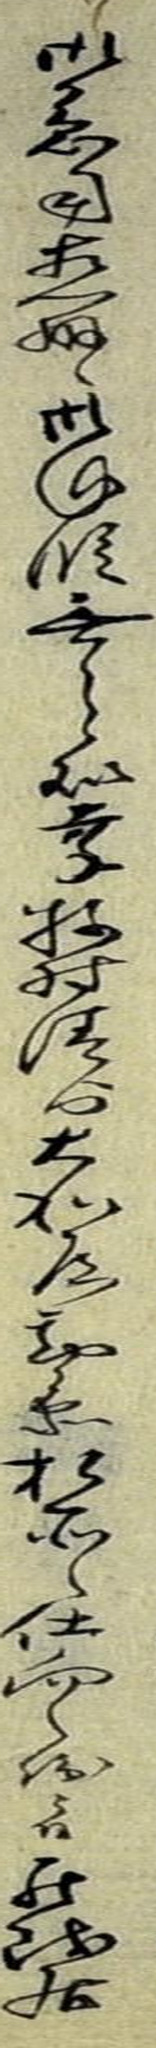御急用相弁候御趣段無之候処幸牧村清右衛門大和屋勘兵衛札所之仕向之儀に付罷越居
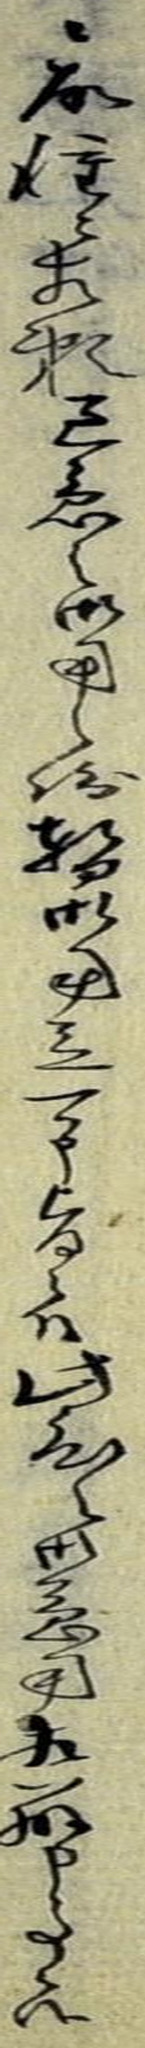候故種々相頼過急之御用之儀暫御用立可申旨に付此度之御急用相弁申事に候
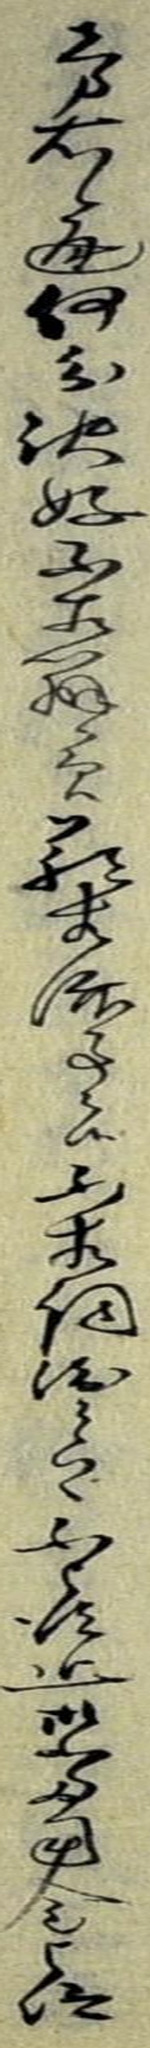旁右之通何分訳好不相弁候而は難相済事に候不相伺儀に候はゞ不被得止御当用金被仰
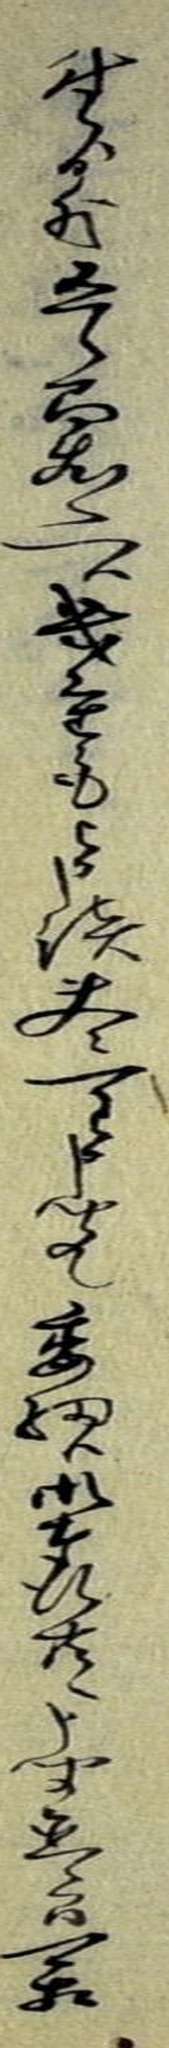付候ゟ外有之間敷候へは幾重にも被申談夫々可被申聞候委細は御奉行共へ申聞置候間可相
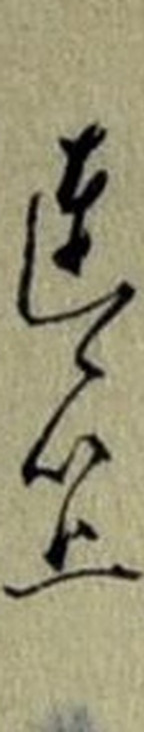達候以上
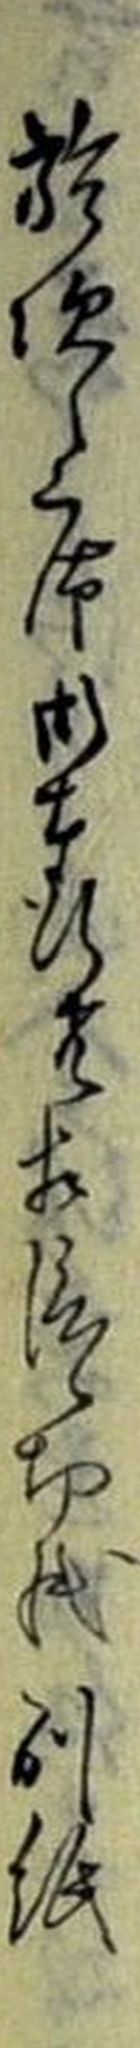於次之席御奉行共相渡候切紙別紙
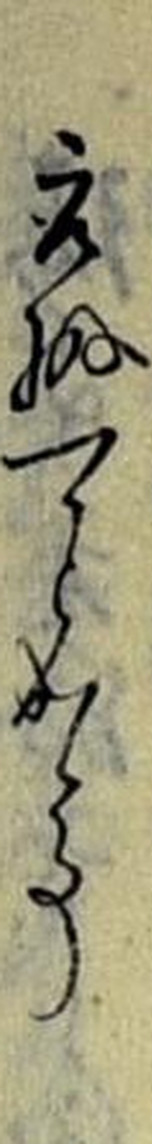取扱可被成候事
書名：命令之部 二
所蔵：福井県文書館 Fukui Prefectural Archives
